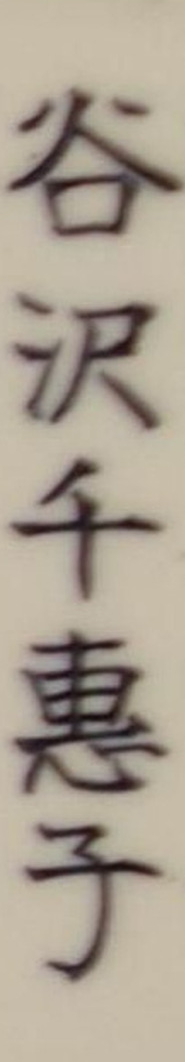谷沢千惠子
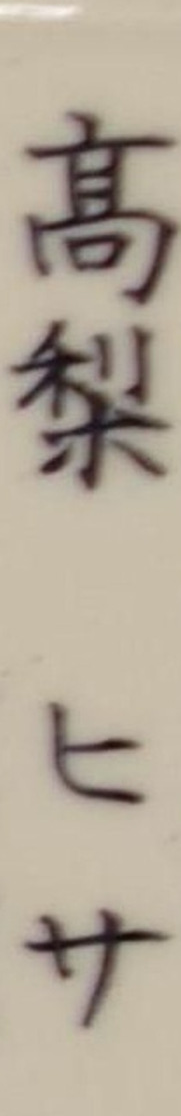高梨ヒサ
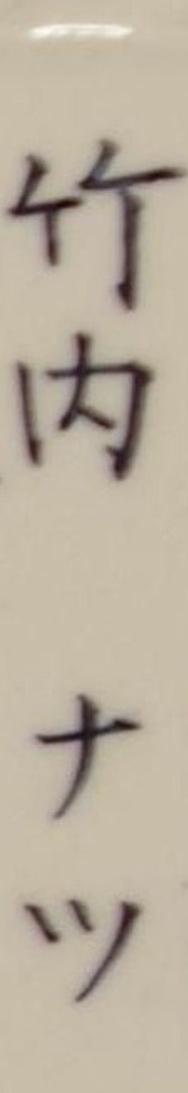竹内ナツ
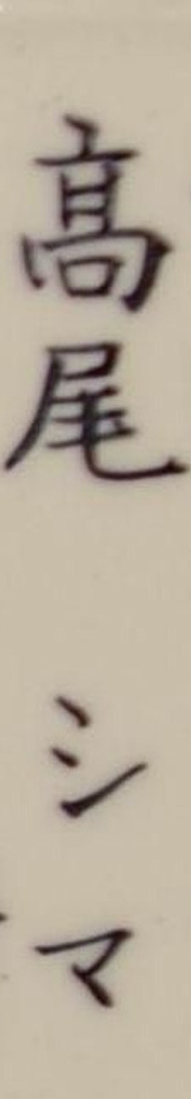高尾シマ
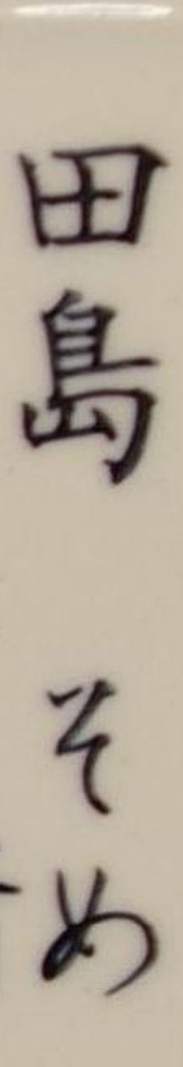田島そめ
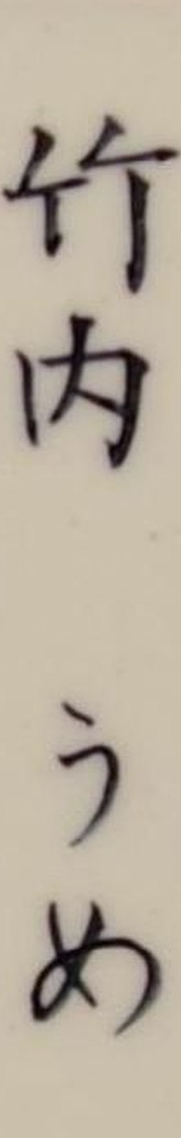竹内うめ
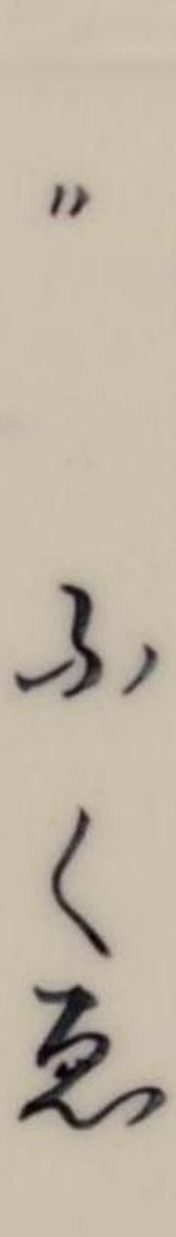ふくゑ
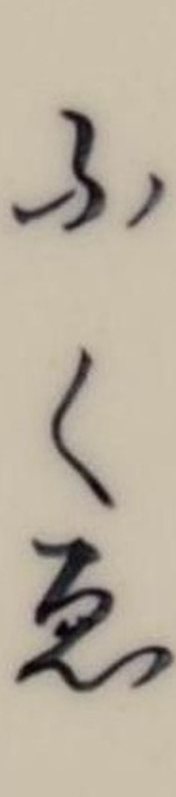ふくゑ
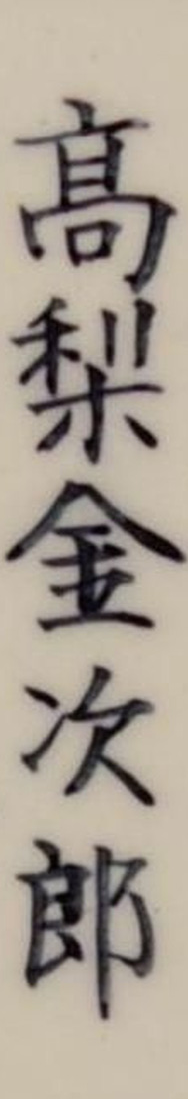高梨金次郎
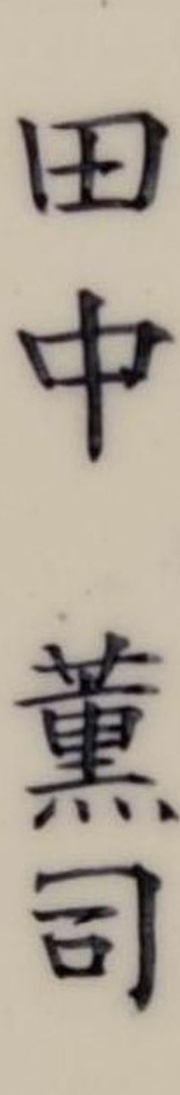田中薫司
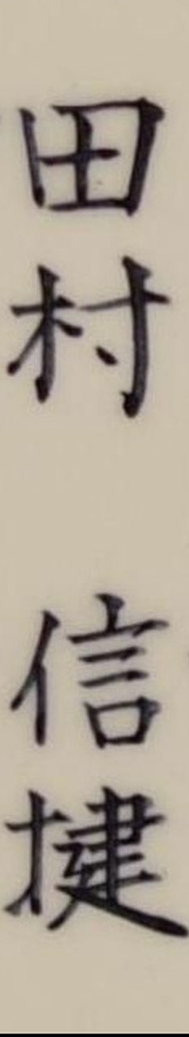田村信揵
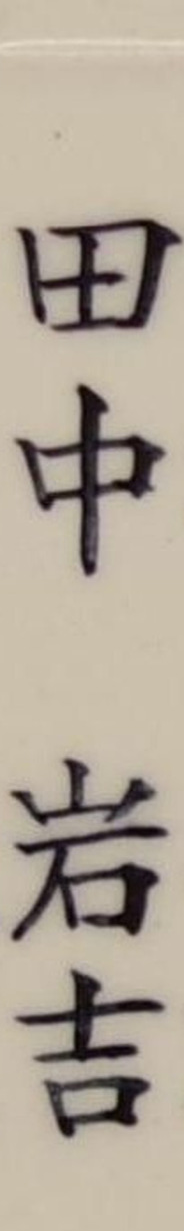田中岩吉
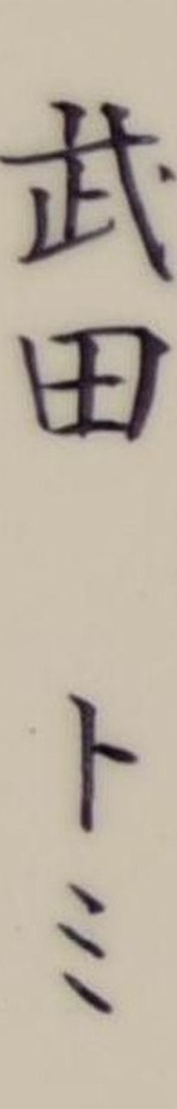武田トミ
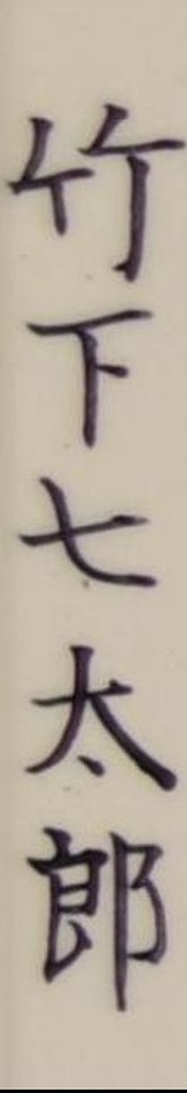竹下七太郎

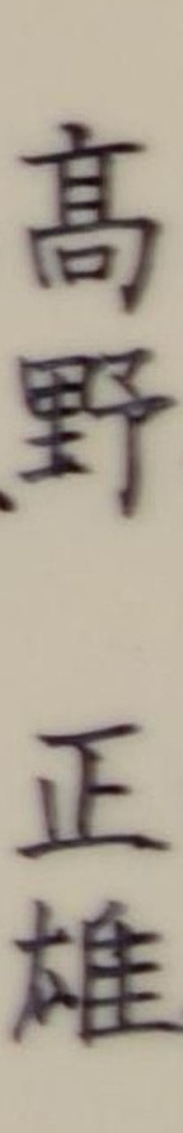高野正雄
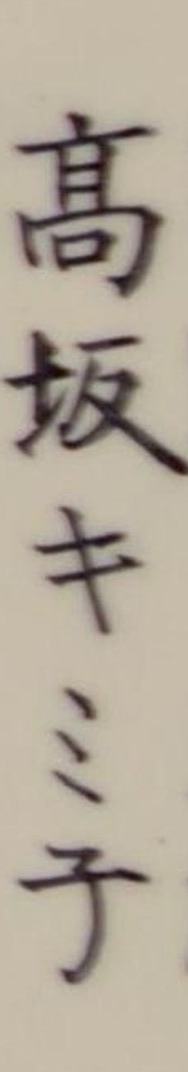高坂キミ子
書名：M~S
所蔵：高野山金剛峯寺
